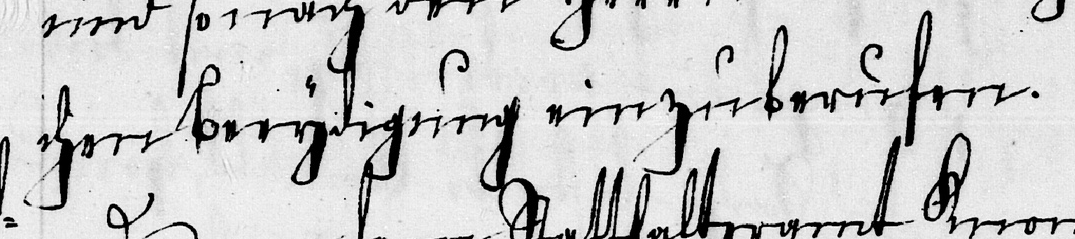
chen Beeydigung einzuberufen.
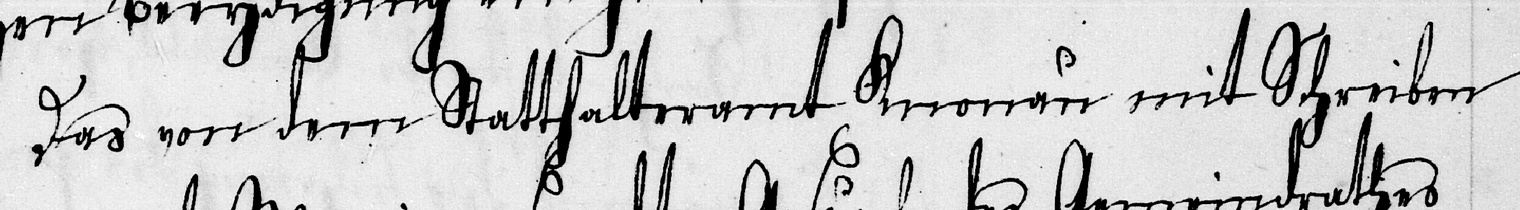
Das von dem Statthalteramt Knonau mit Schreiben
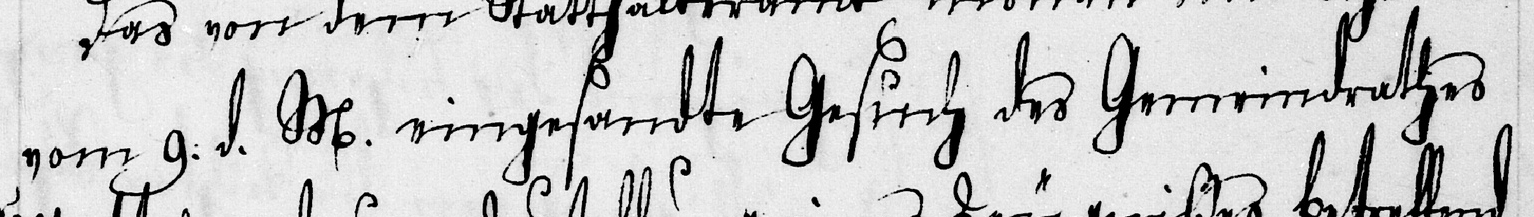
vom 9. d. M. eingesandte Gesuch des Gemeindrathes
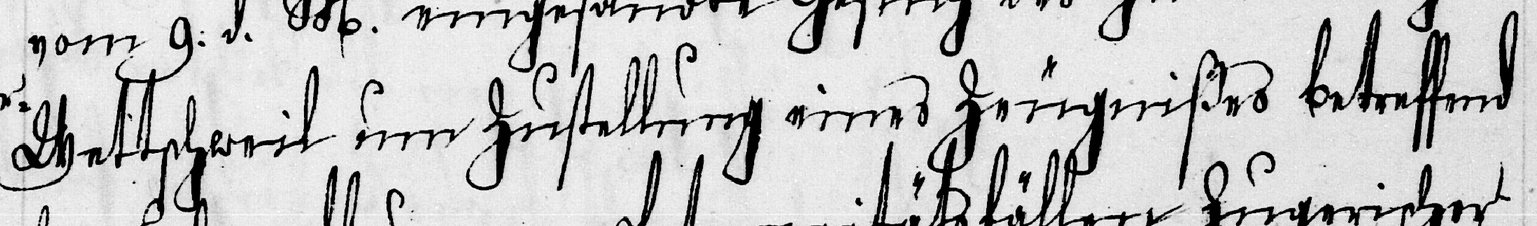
Wettschweil um Zustellung eines Zeugnißes betreffe¬
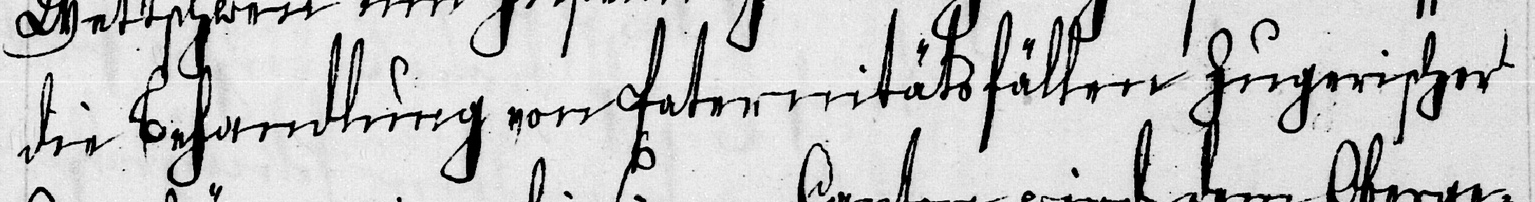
die Behandlung von Paternitätsfällen Zugerischer
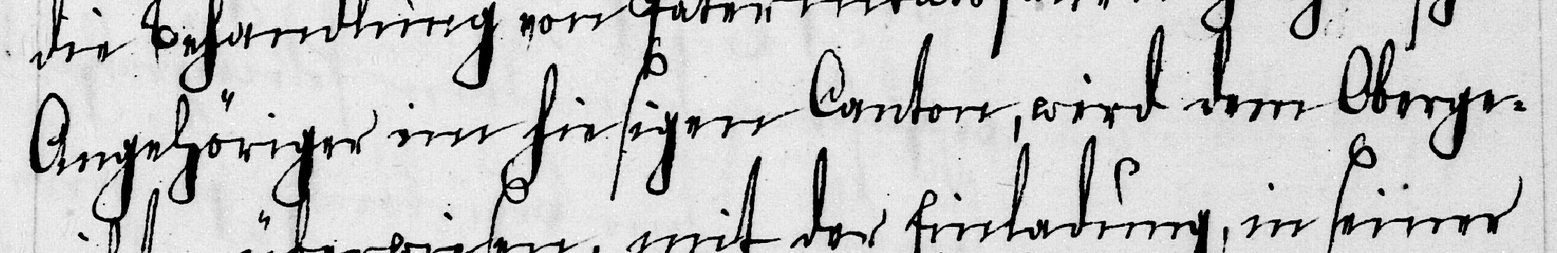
Angehöriger im hiesigen Canton, wird dem Oberge¬
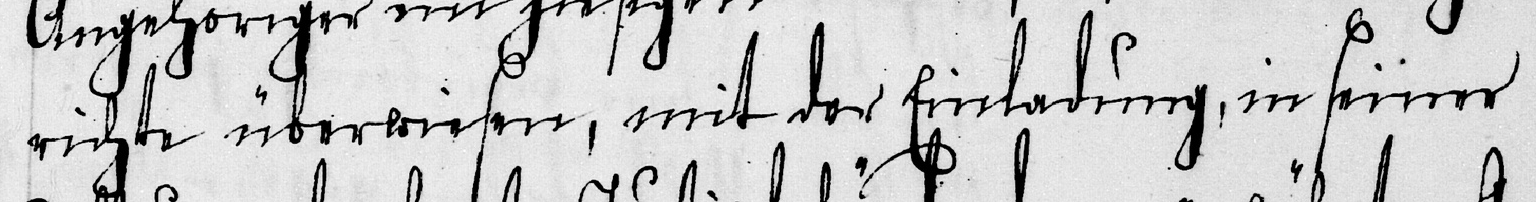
richte überwiesen, mit der Einladung, in seiner
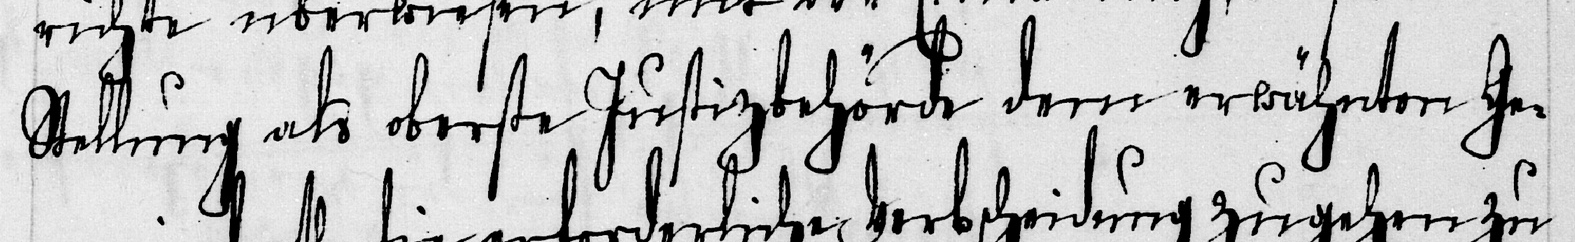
Stellung als oberste Justizbehörde dem erwähnten Ge¬
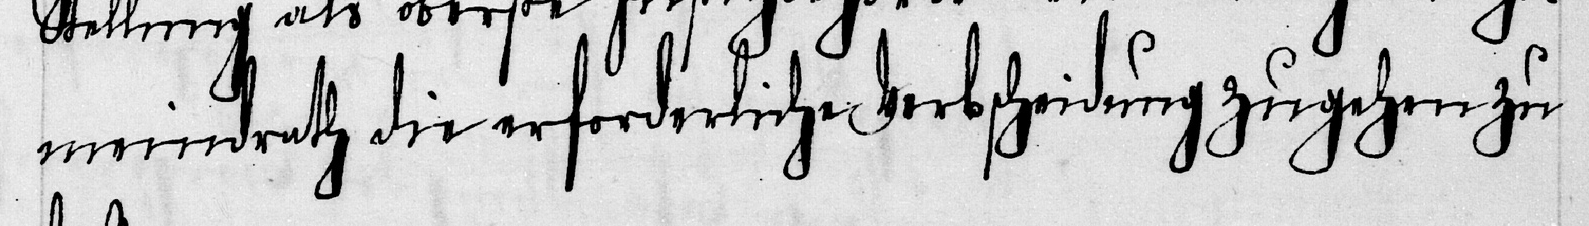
meindrath die erforderliche Verbscheidung zugehen zu
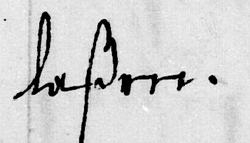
laßen.
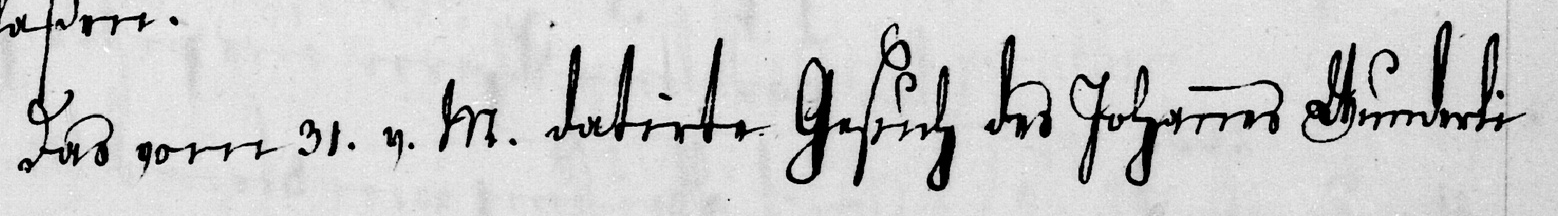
Das vom 31. v. M. datirte Gesuch des Johannes Wunderli
